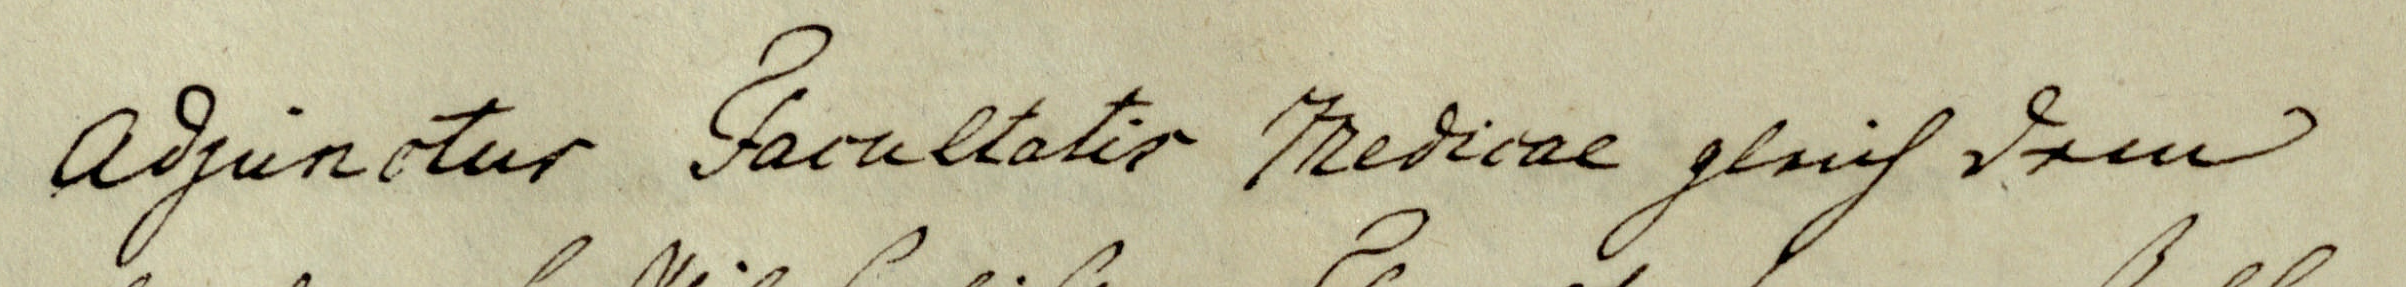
Adjunctus Facultatis Medicae gleich dem
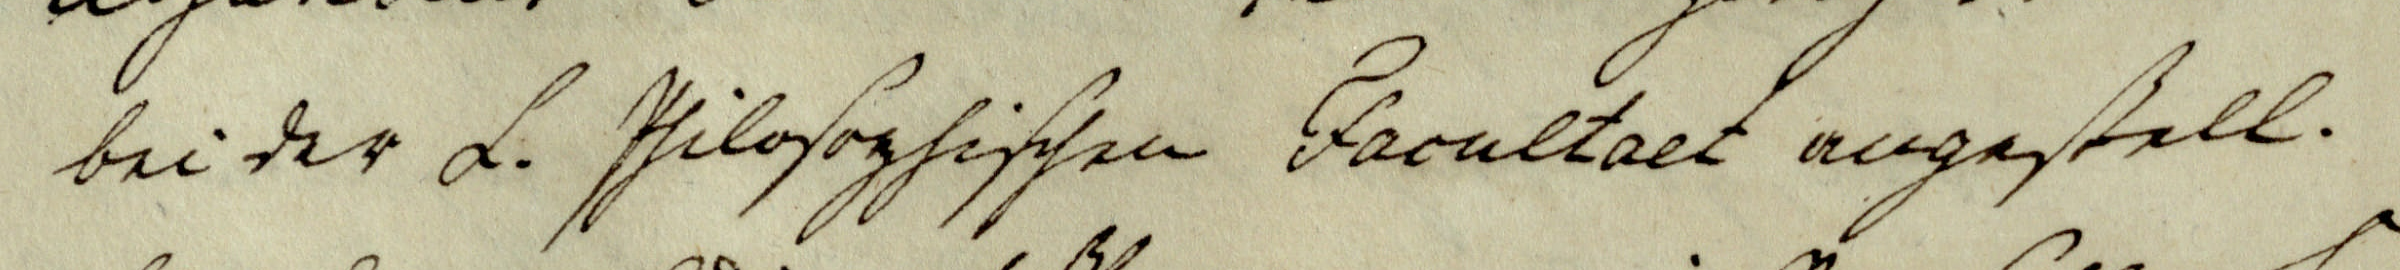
bei der L. Philosophischen Facultaet angestell¬
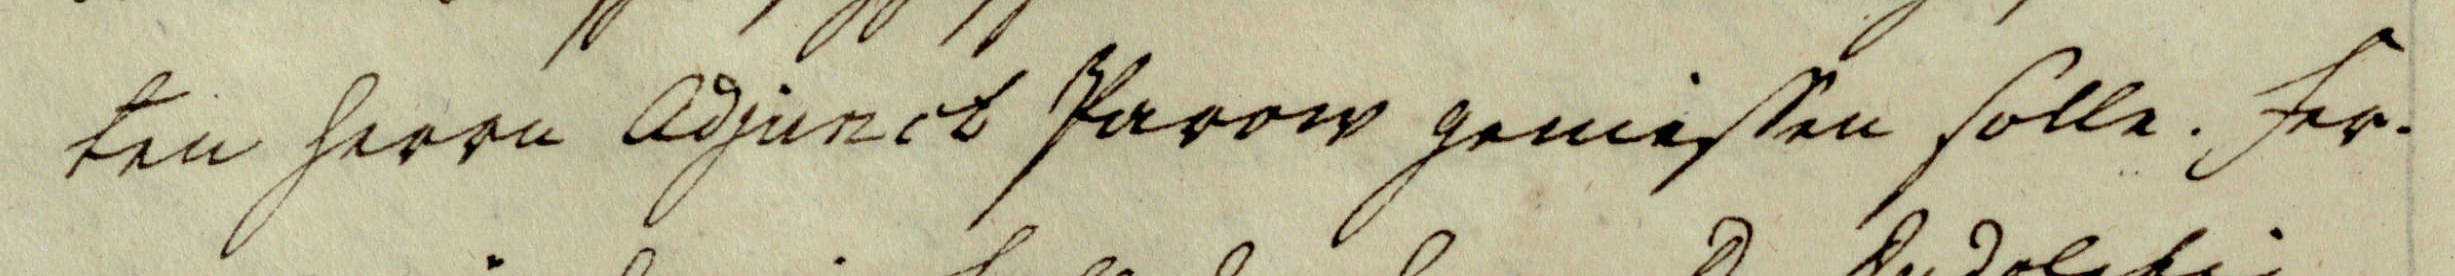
ten Herrn Adjunct Parow geniessen solle. Fer¬
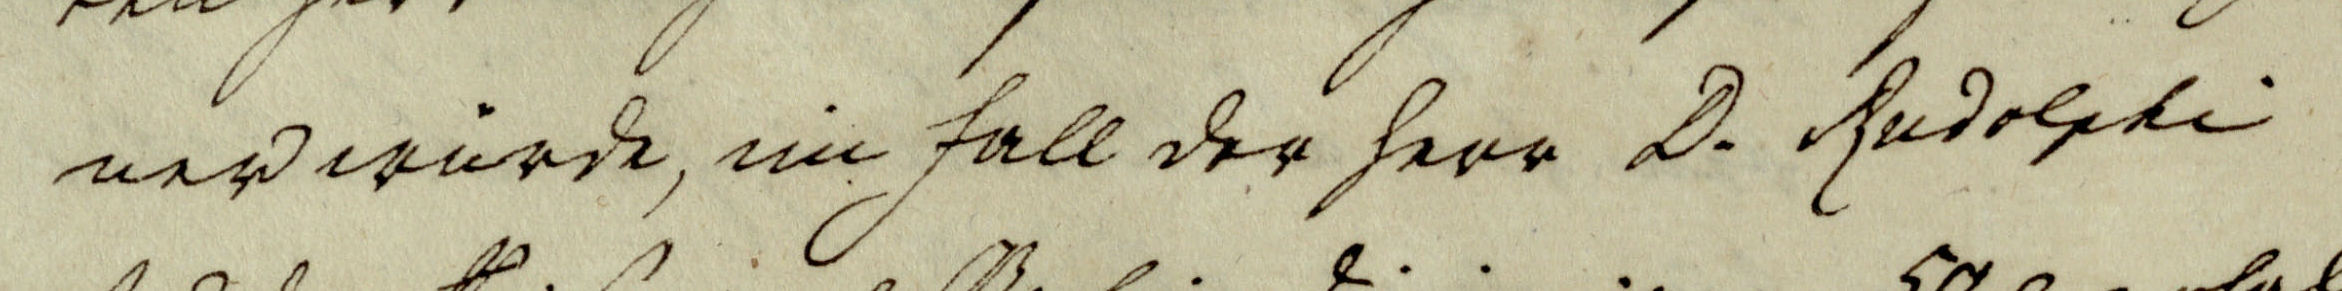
ner würde, im Fall der Herr D. Rudolphi
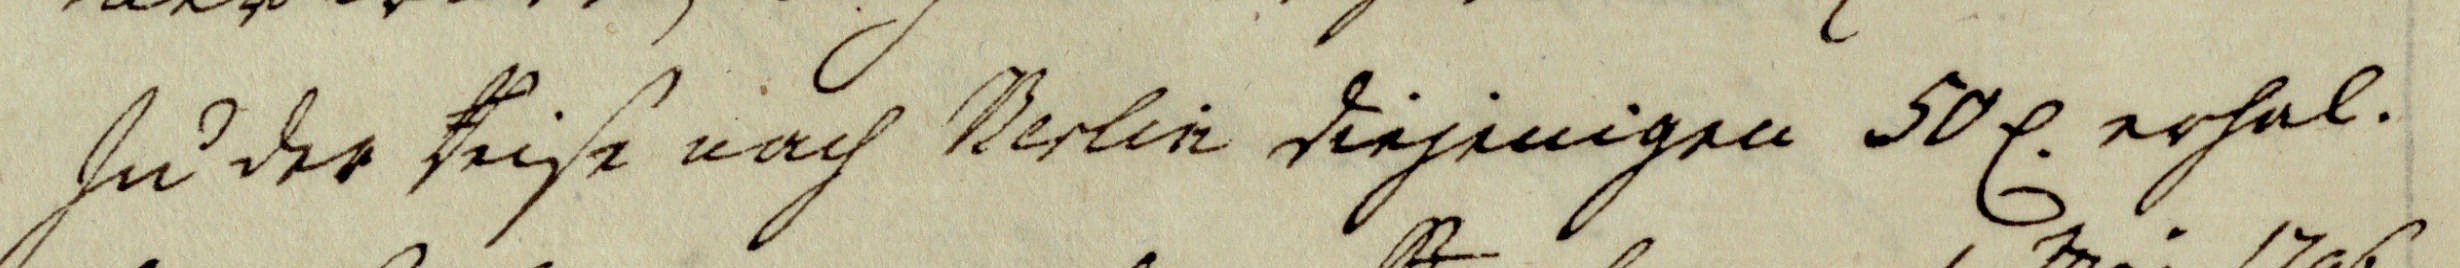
zu der Reise nach Berlin diejenigen 50 l. erhal¬
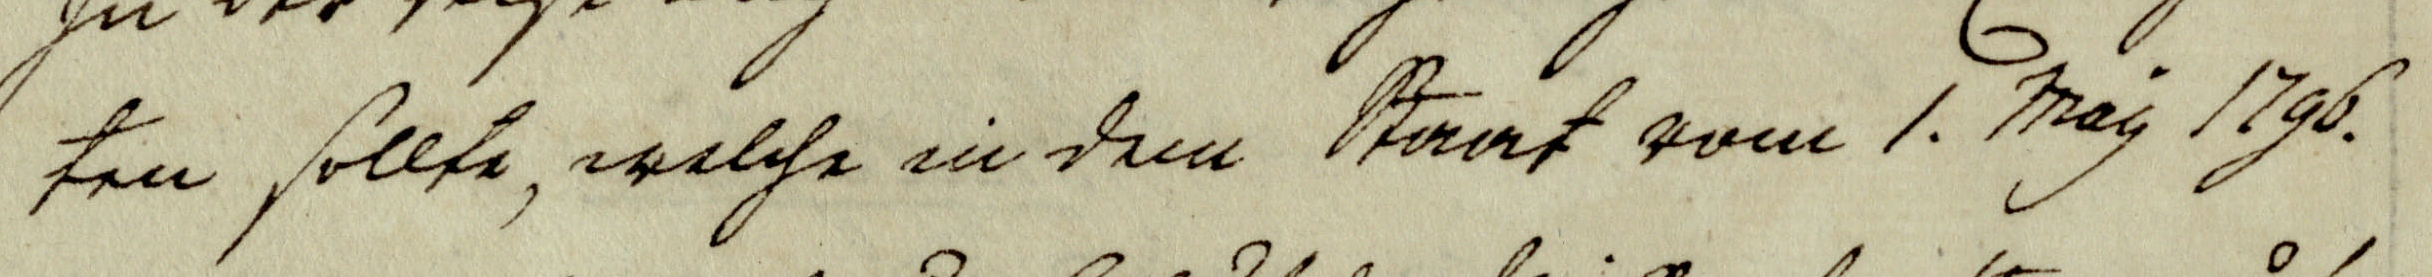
ten sollte, welche in dem Staat vom 1. Maÿ 1796.
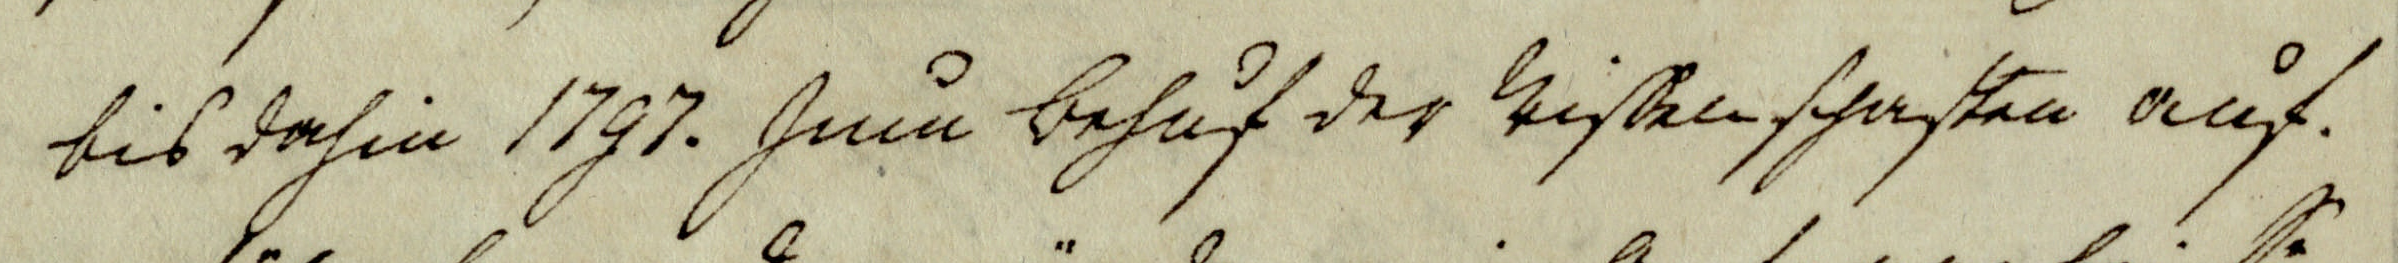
bis dahin 1797. zum Behuf der Wissenschaften auf¬
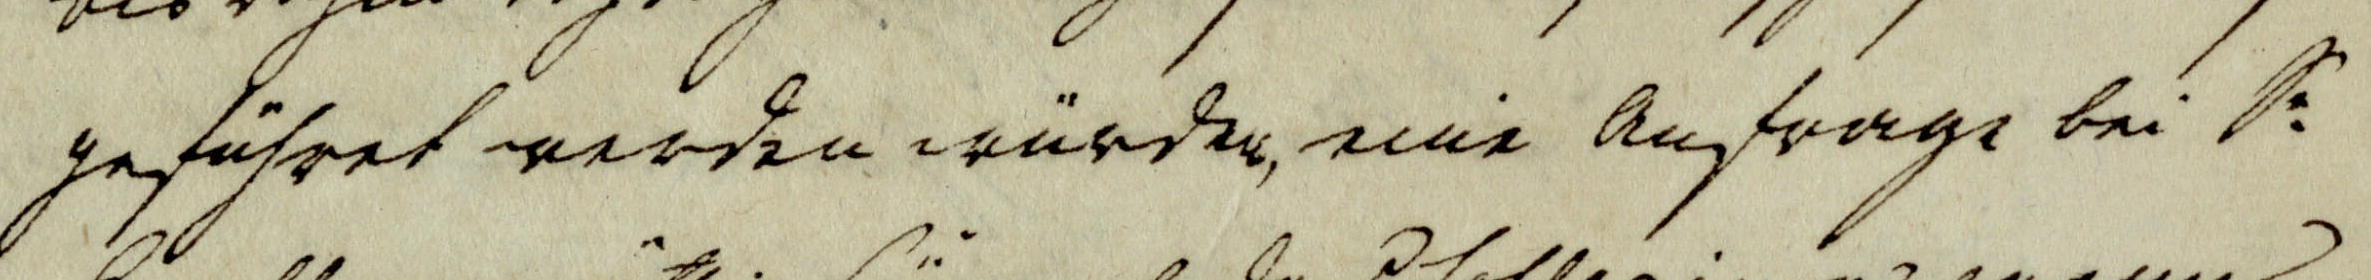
geführet werden würden, eine Anfrage bei Sr.
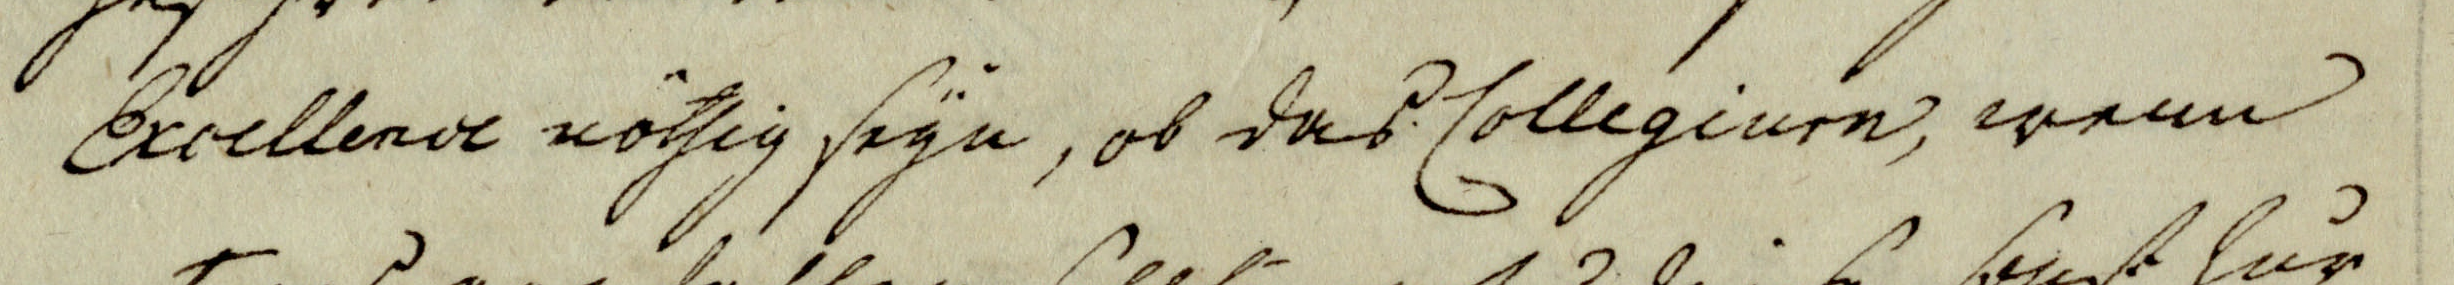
Excellence nöthig seÿn, ob das Collegium, wenn
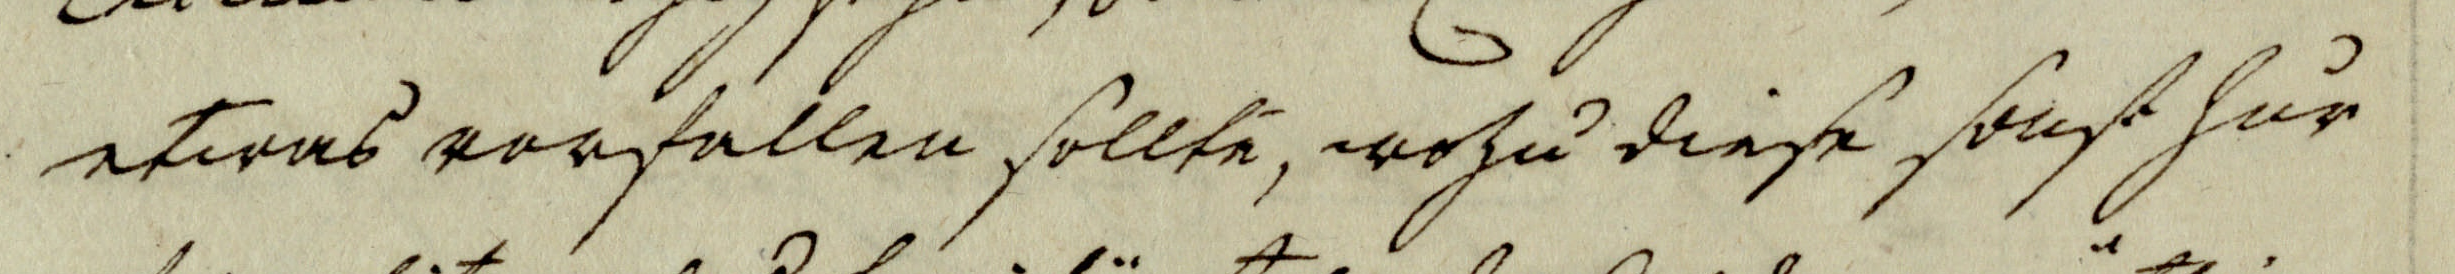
etwas vorfallen sollte, wozu diese sonst zur
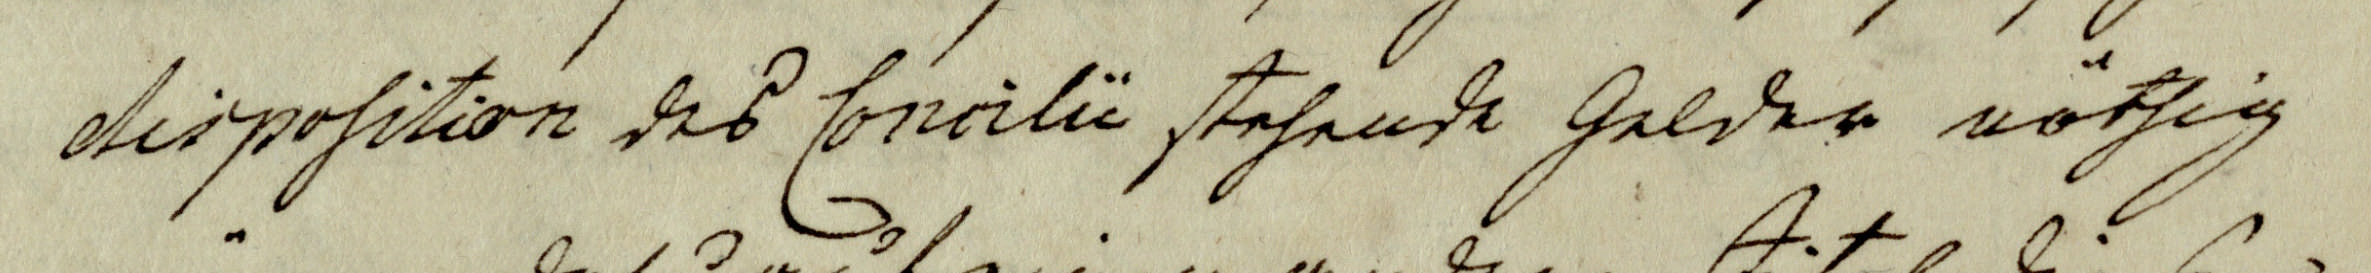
disposition des Concilii stehende Gelder nöthig
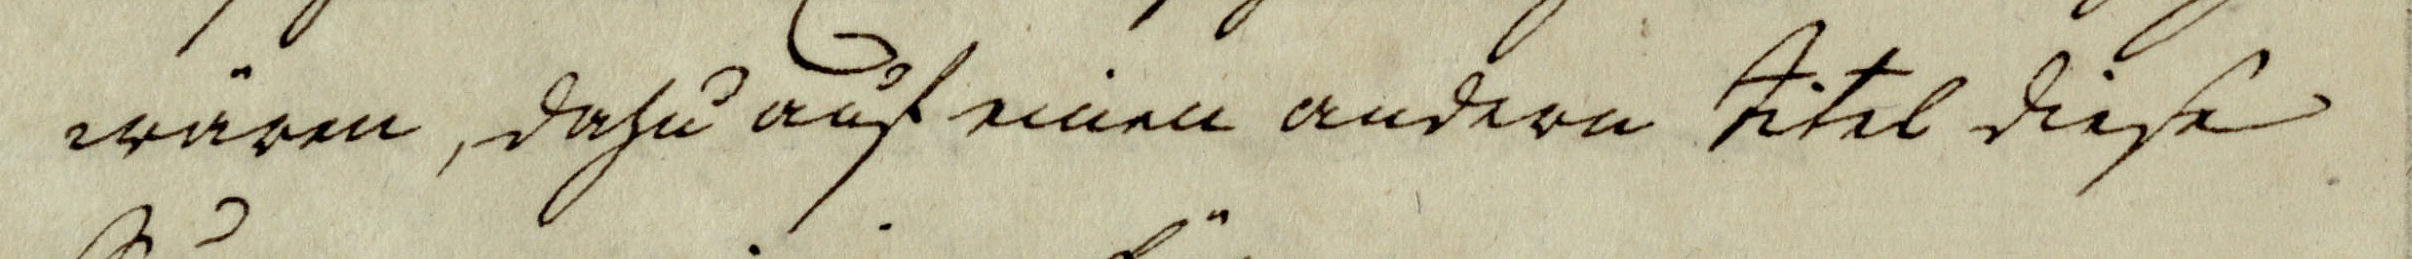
wären, dazu auf einen andern Titel diese
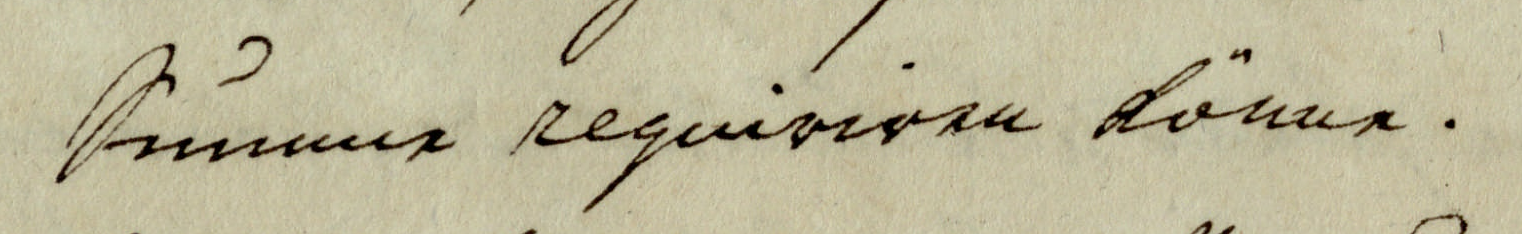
Summe requiriren könne.
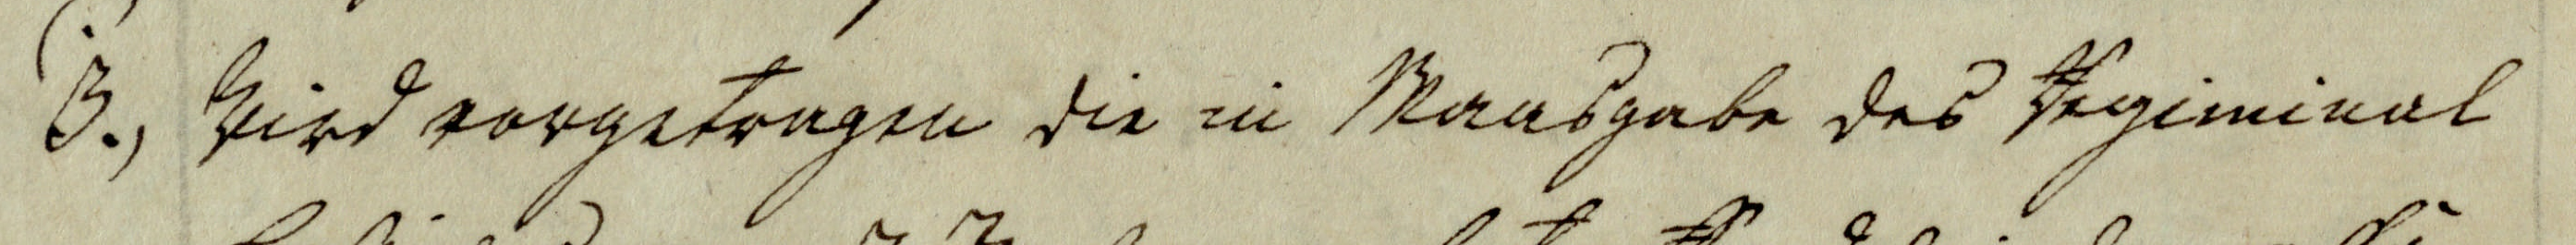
3., Wird vorgetragen die in Maasgabe des Regiminal
